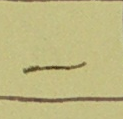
--
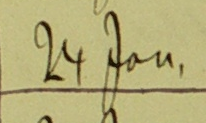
24. Jan
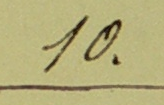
10
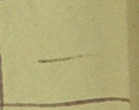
--
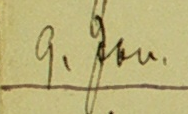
9. Jan.
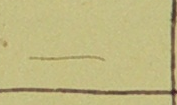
--
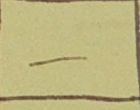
--
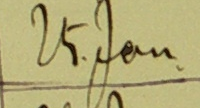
25. Jan.
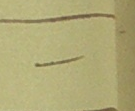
--
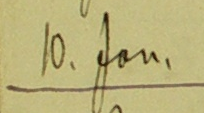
10. Jan.
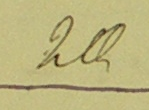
20
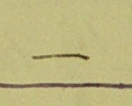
--
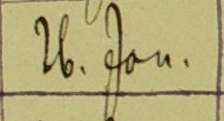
26. Jan.
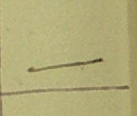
--
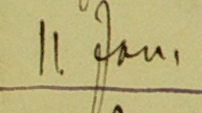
11. Jan.
